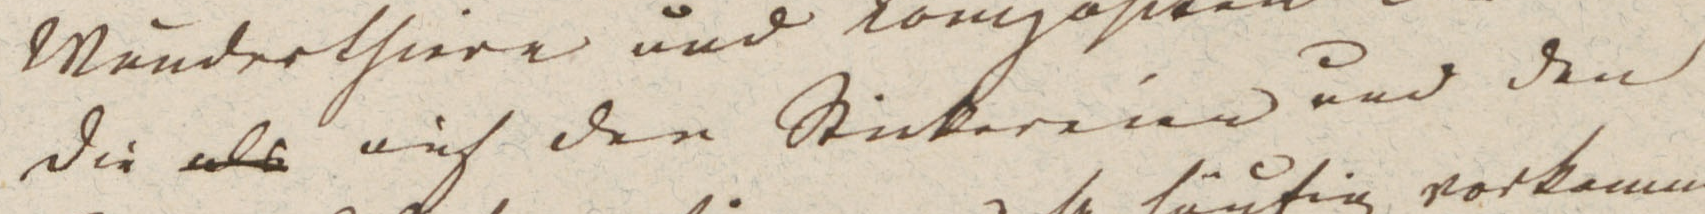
die als auf den Stickereien und den
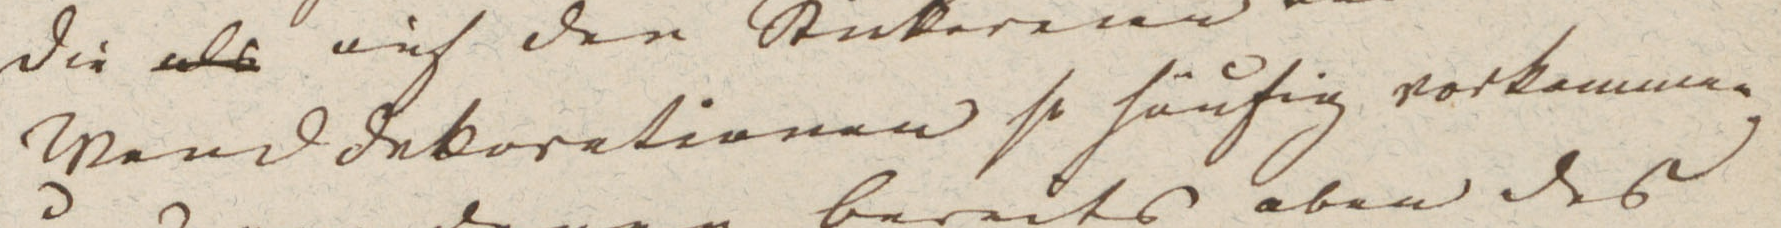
Wanddekorationen so häufig vorkommen
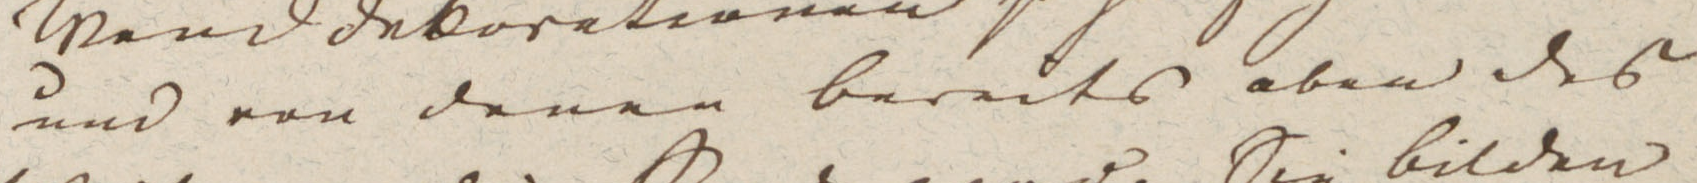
und von denen bereits oben des
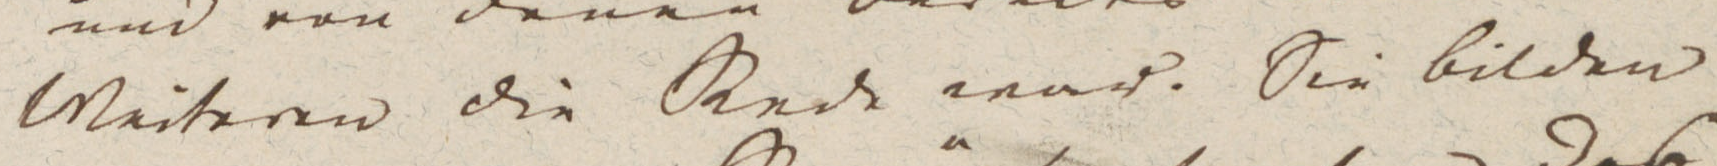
Weiteren die Rede war. Sie bilden
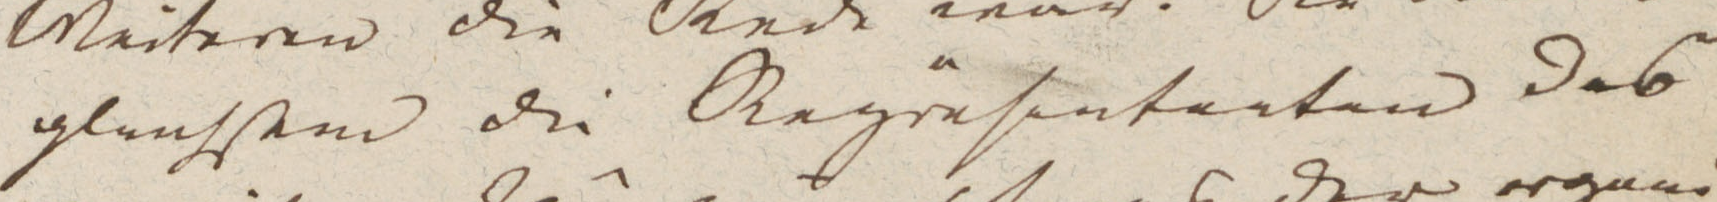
gleichsam die Repräsentanten des
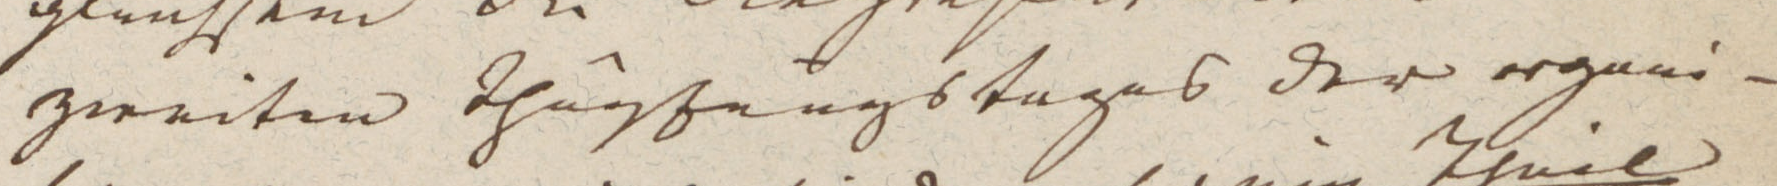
zweiten Schöpfungstages der organi-
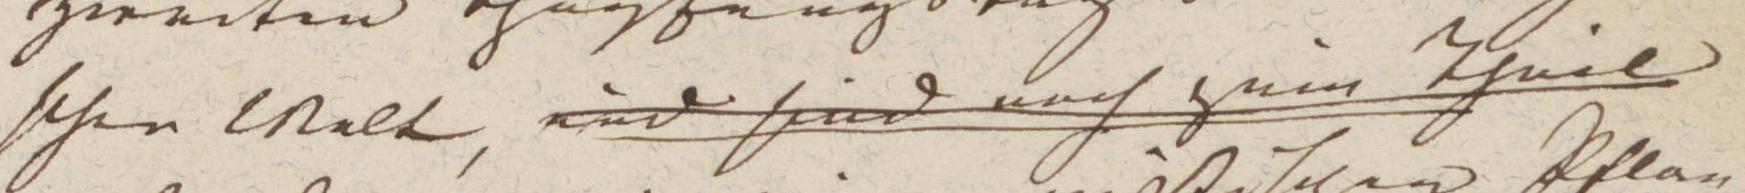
schen Welt, und sind noch zum Theil
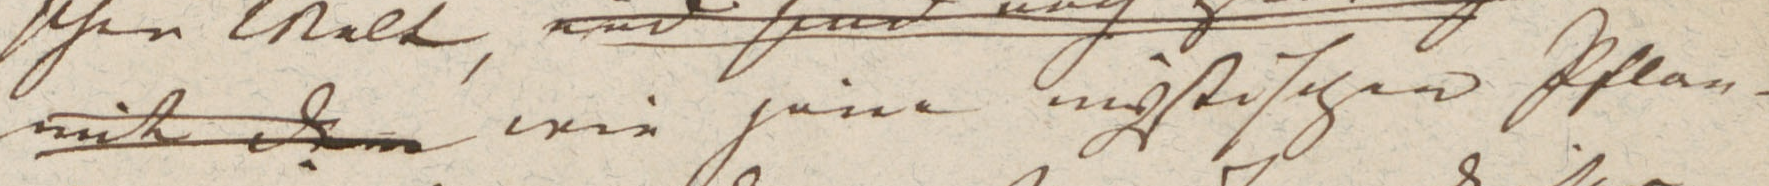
mit dem wie jene mystischen Pflan-
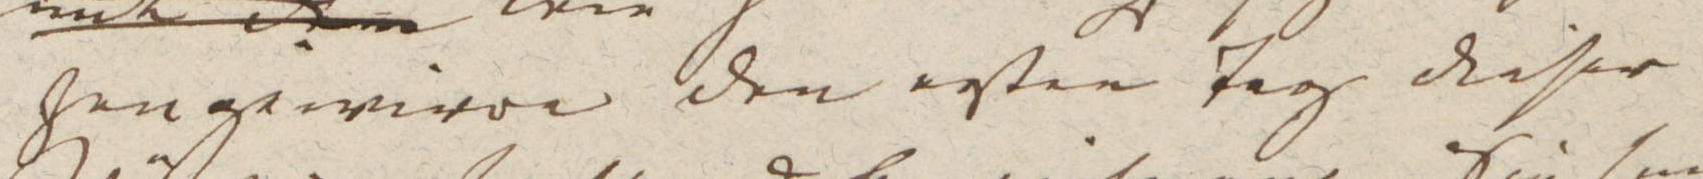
zengewirre den ersten Tag dieser
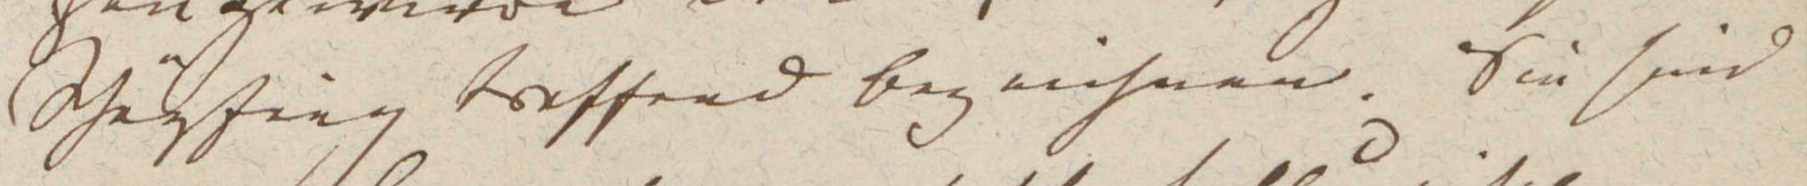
Schöpfung treffend bezeichnen. Sie sind
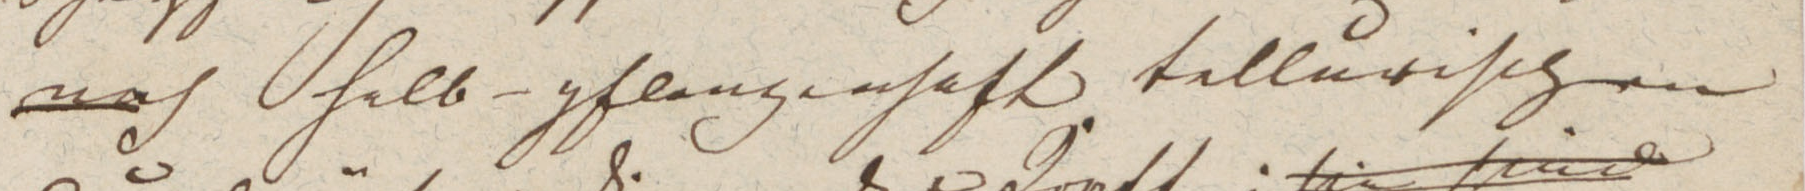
noch halb-pflazenhaft tellurischen
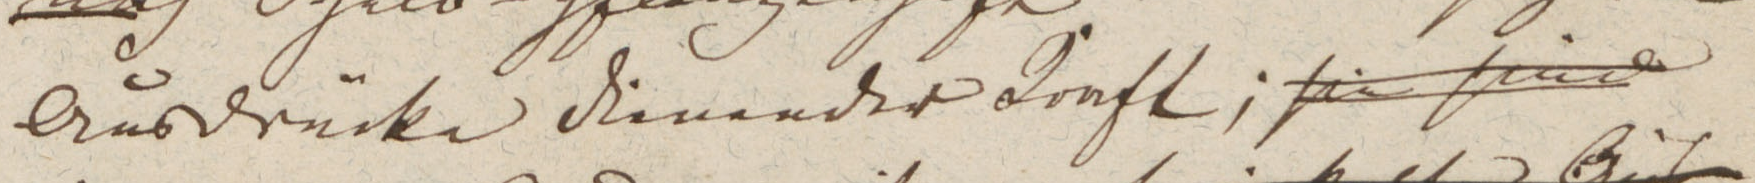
Ausdrücke dienender Kraft; sie sind
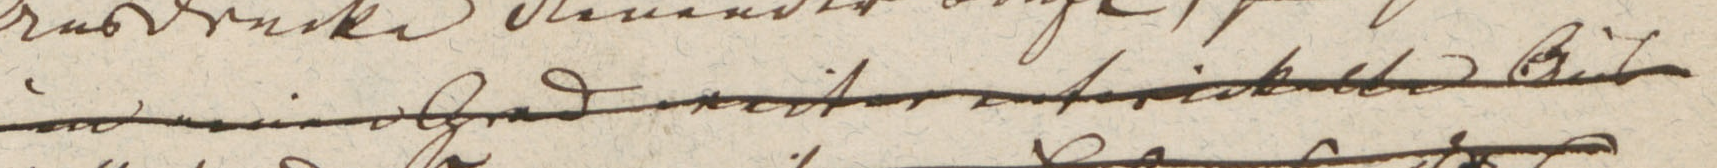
um einen Grad weiter entwickelte Aus-
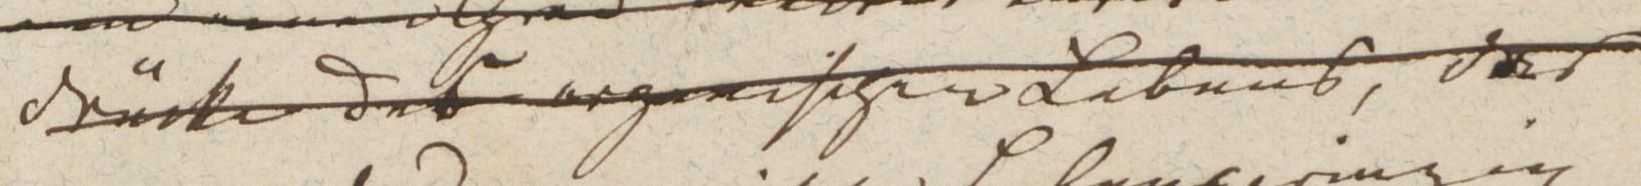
drücke des organischen Lebens, das
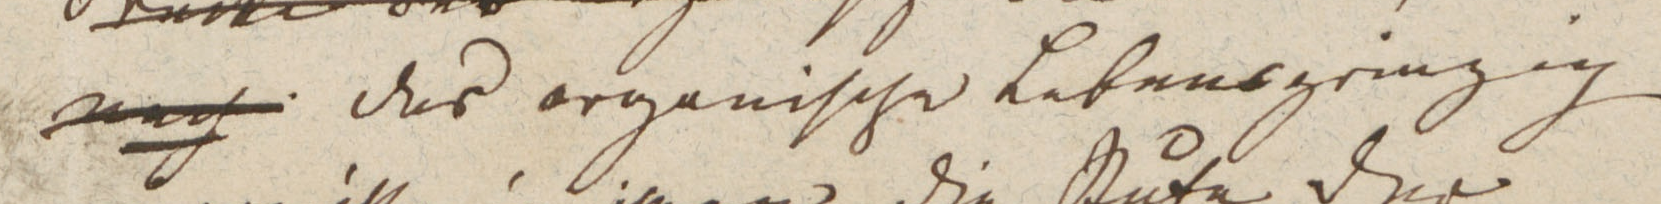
nach das organische Lebensprinzip
